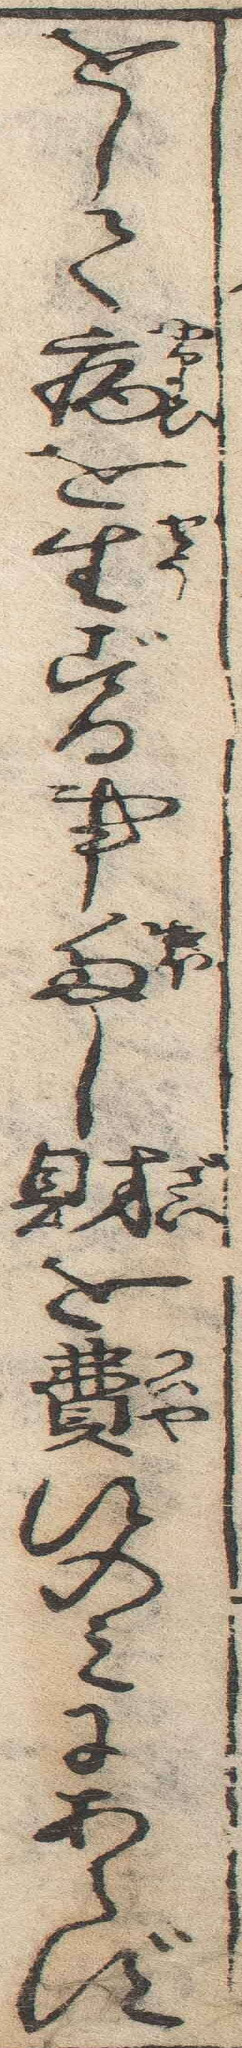をして病を生ずる事多し財を費すのみにあらず
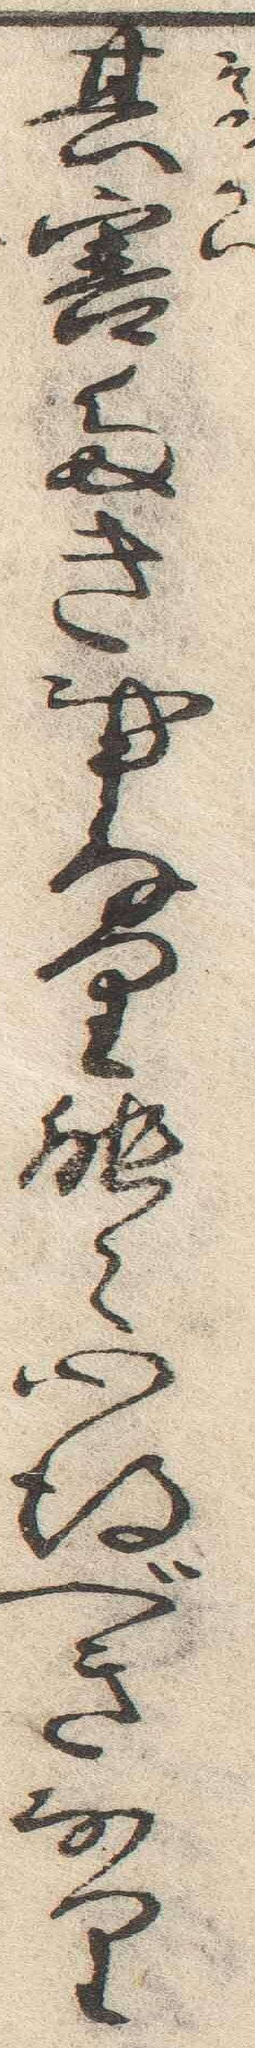其害多き事なり能〻心得べきなり
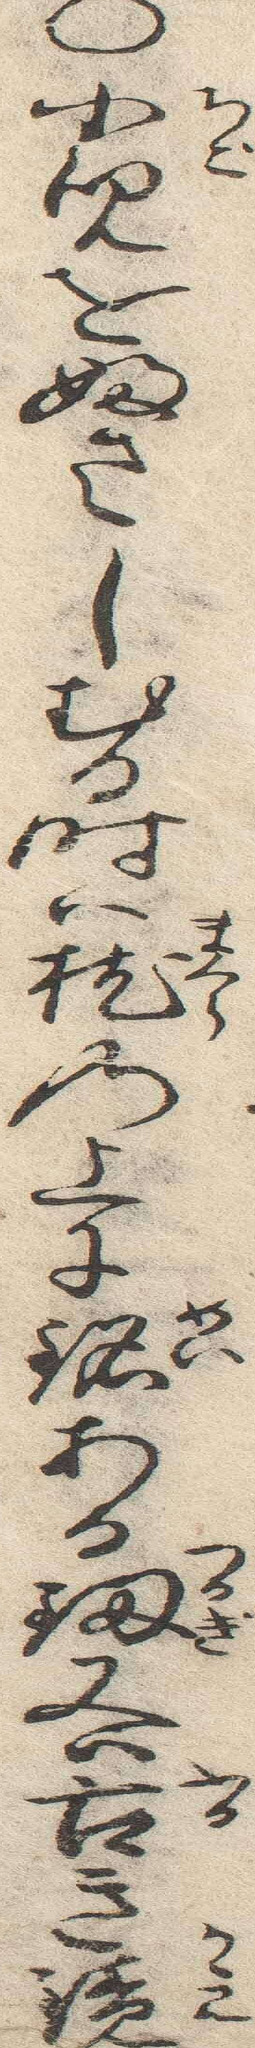◯小児をふさしむる時は枕の上に銘ある釼又は古き鏡
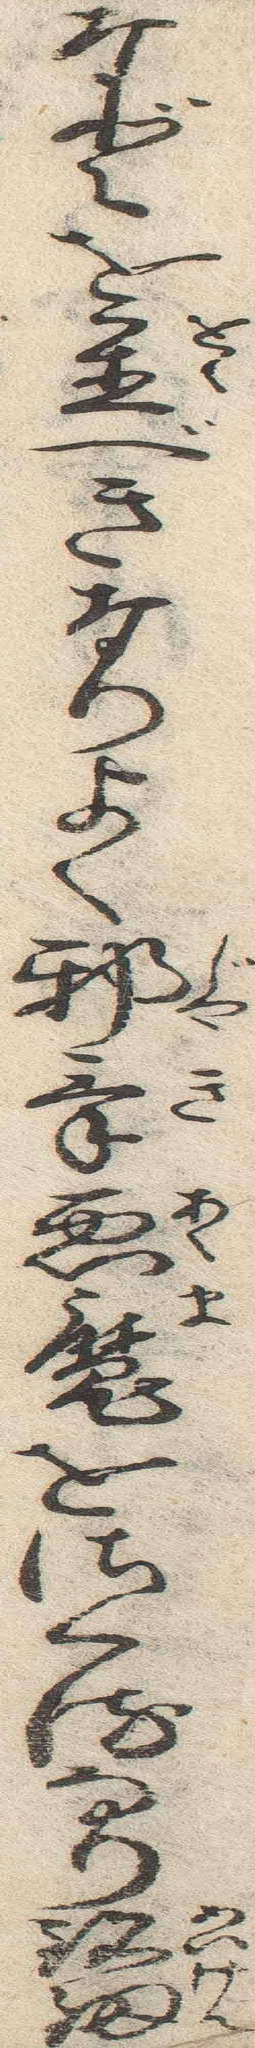などを置べきなりよく邪氣悪魔をさくるなり銘釼
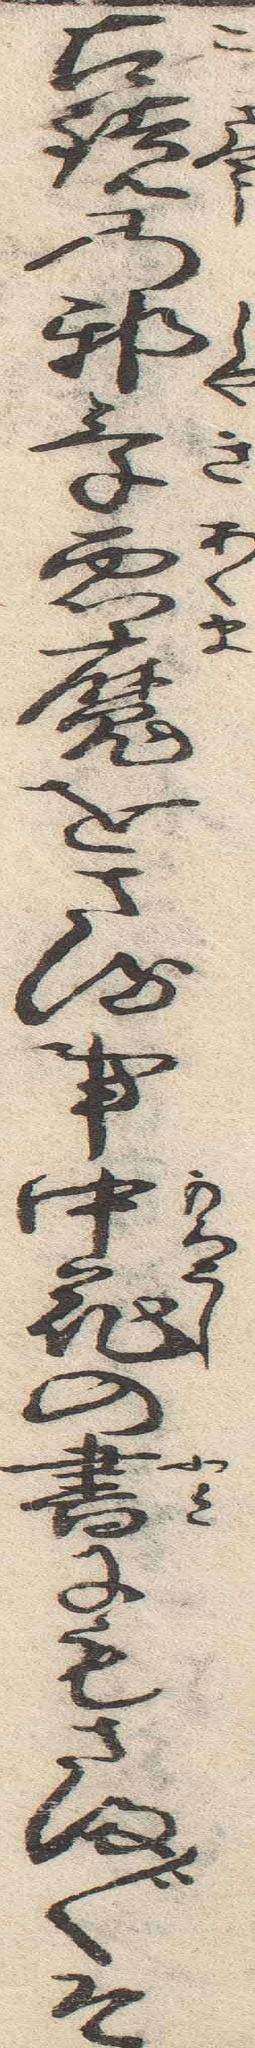古鏡の邪氣悪魔をさる事中花の書にもさま〴〵そ
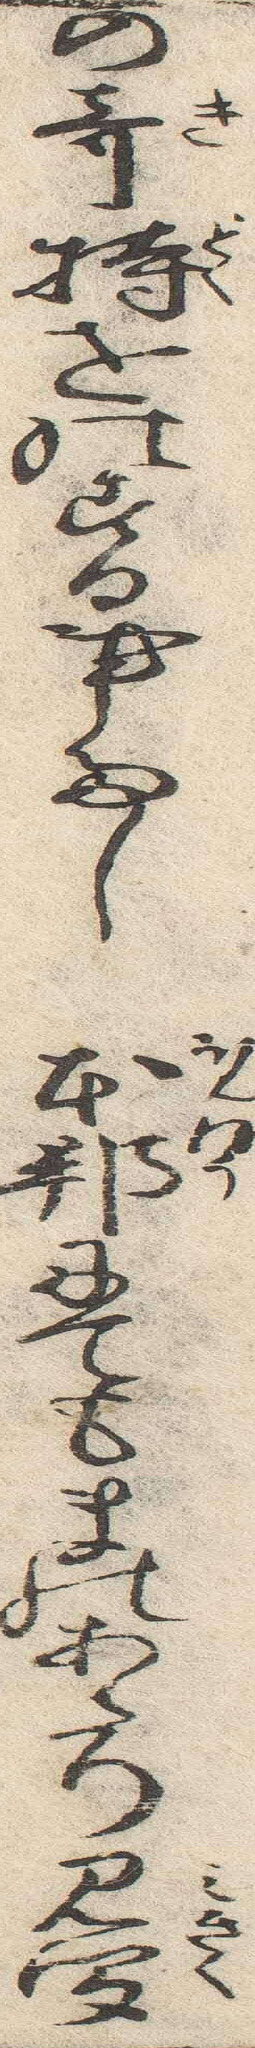の奇特をのする事多し本邦にてもまのあたり見聞
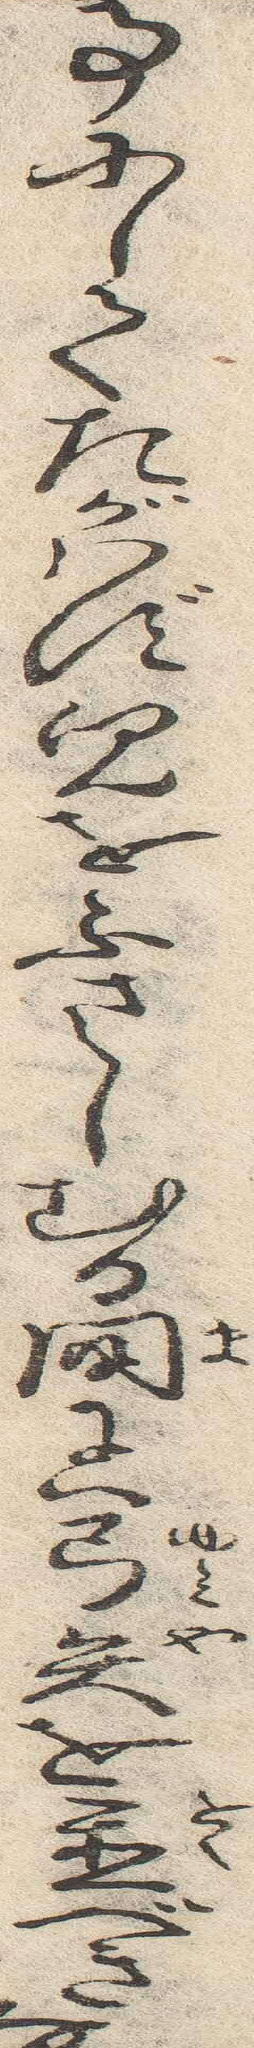事にしてたがはず児をふさしむる間には弓矢を置べきな
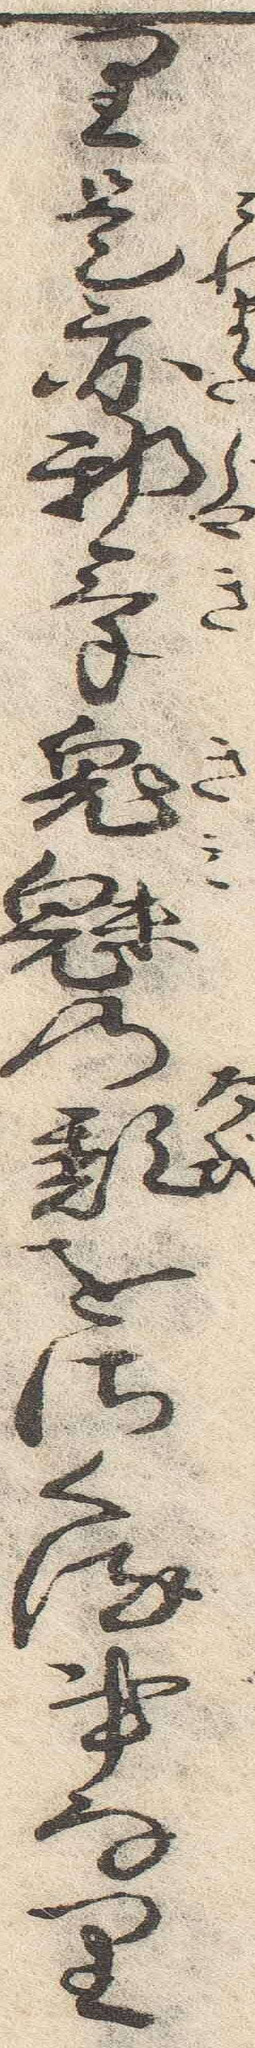り是亦邪氣鬼魅の類をさくる事なり
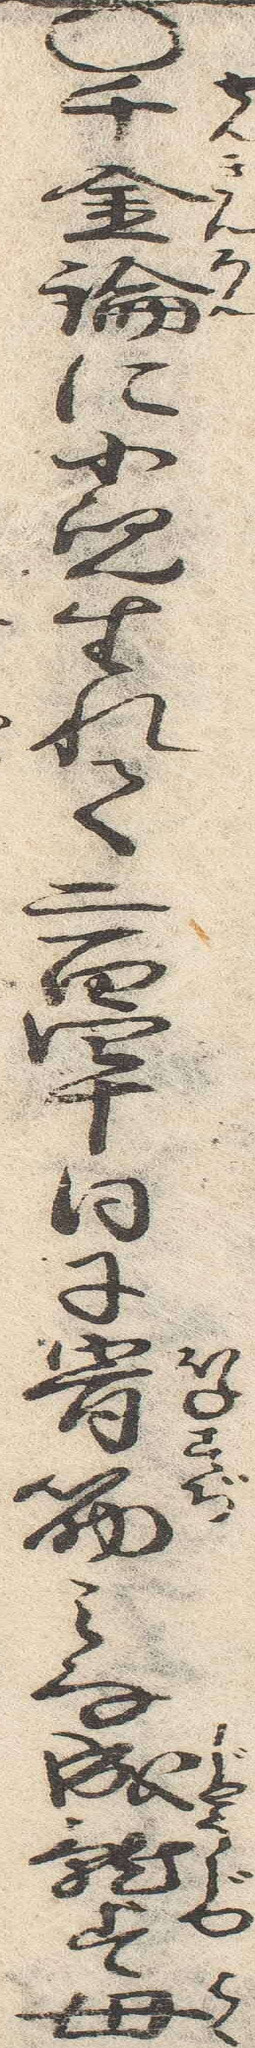◯千金論に小児生れて二百四十日に骨筋みな成就す母
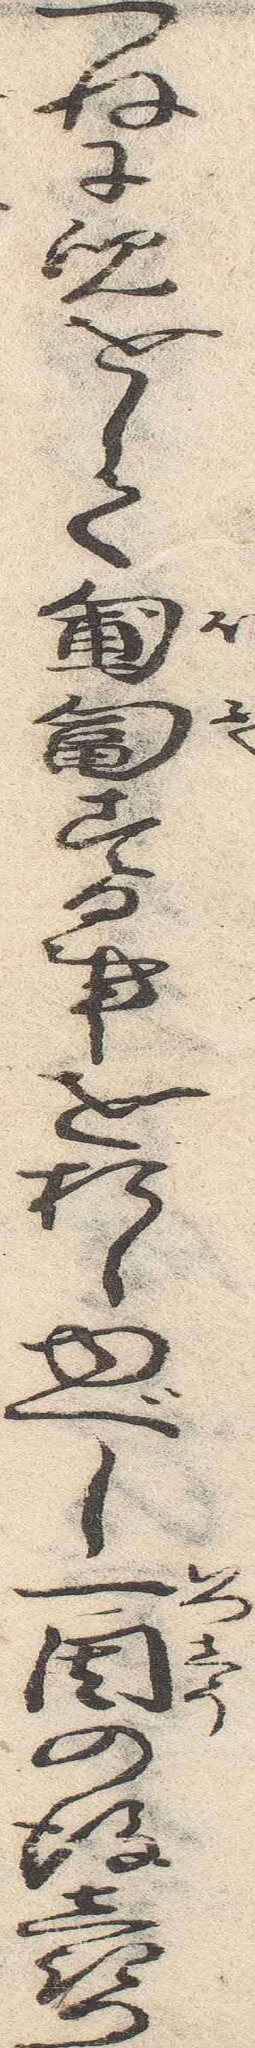つねに児をして匍匐する事をおしゆべし一周の後しきり
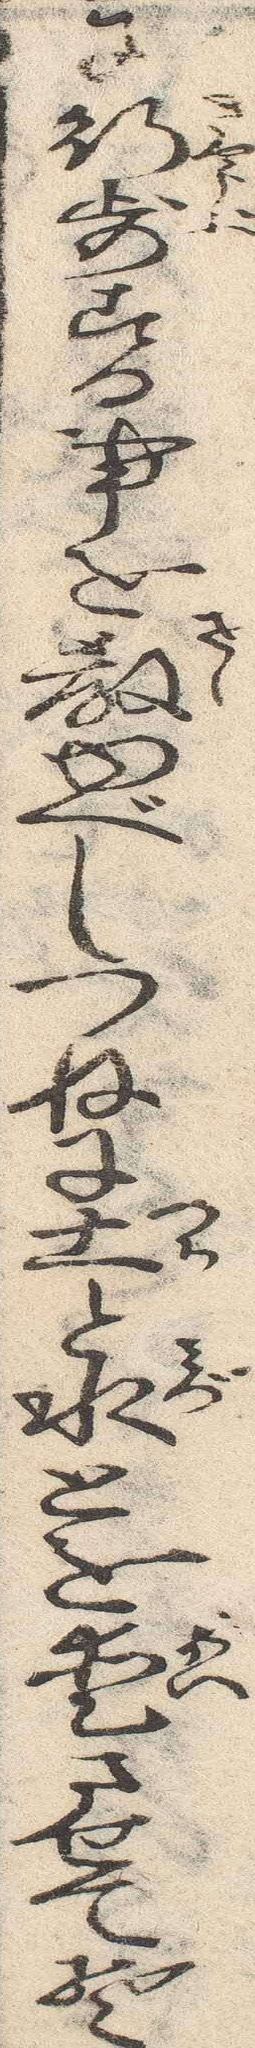に行歩する事を教ゆべしつねに土と水とを愛させてそ
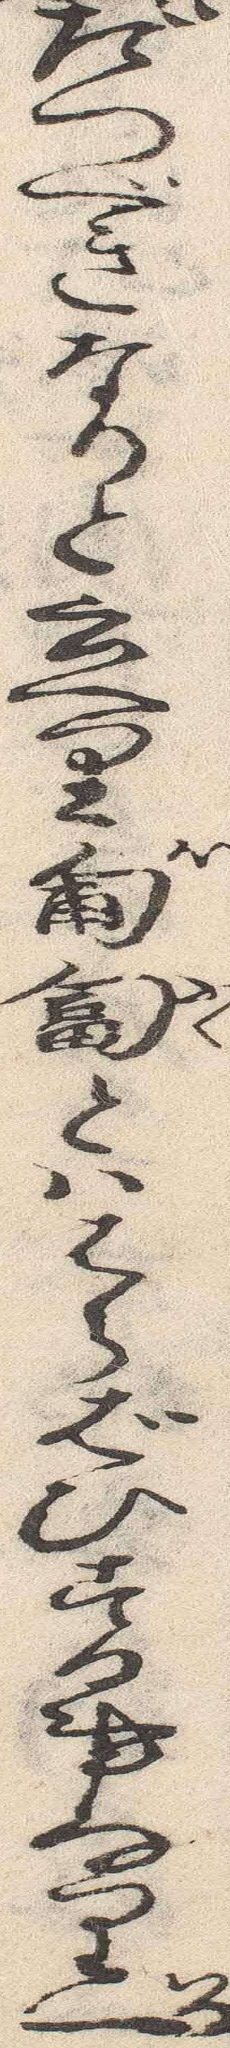だつべきなりと云へり匍匐とははらばひする事なり一
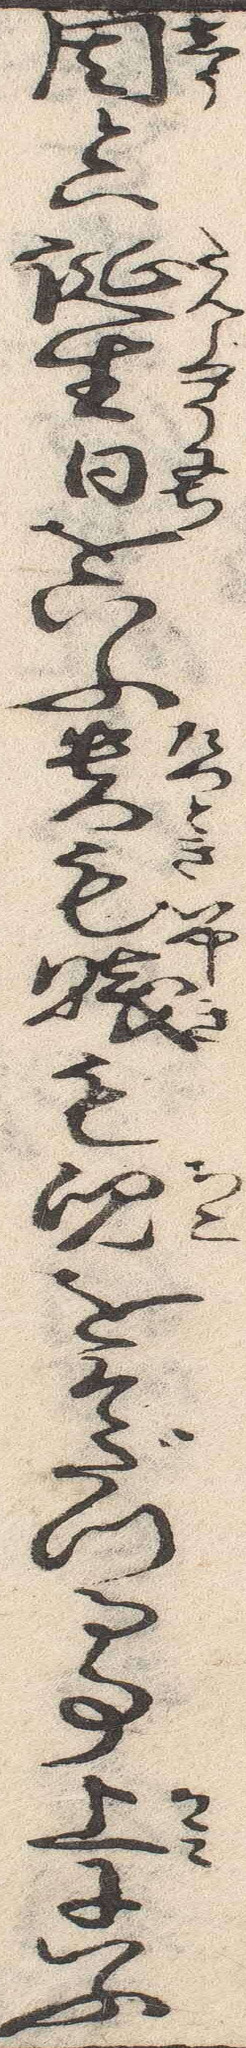周とは誕生日をいふ貴も賤も児をそだつる事上にいふ
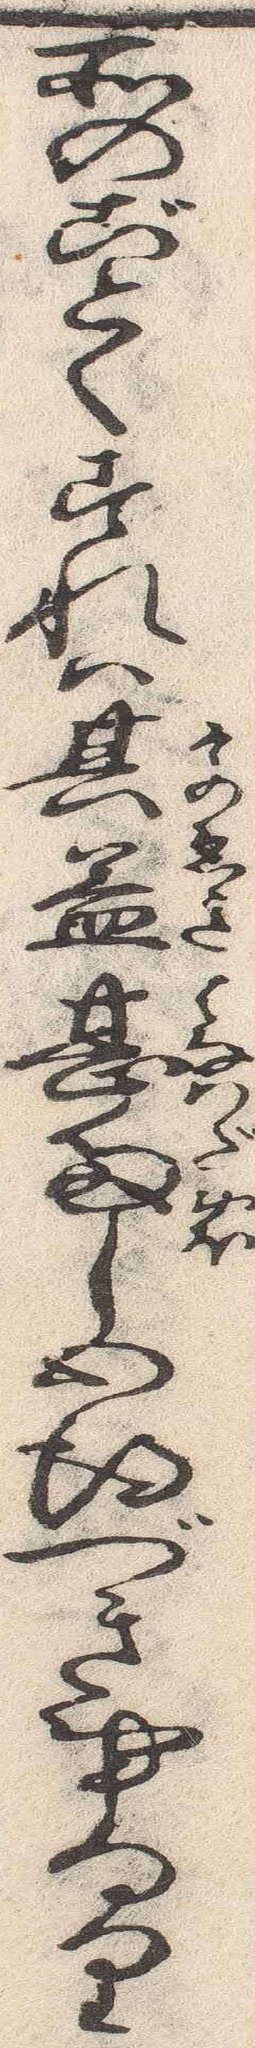所のごとくすれは其益甚多し心得べき事なり
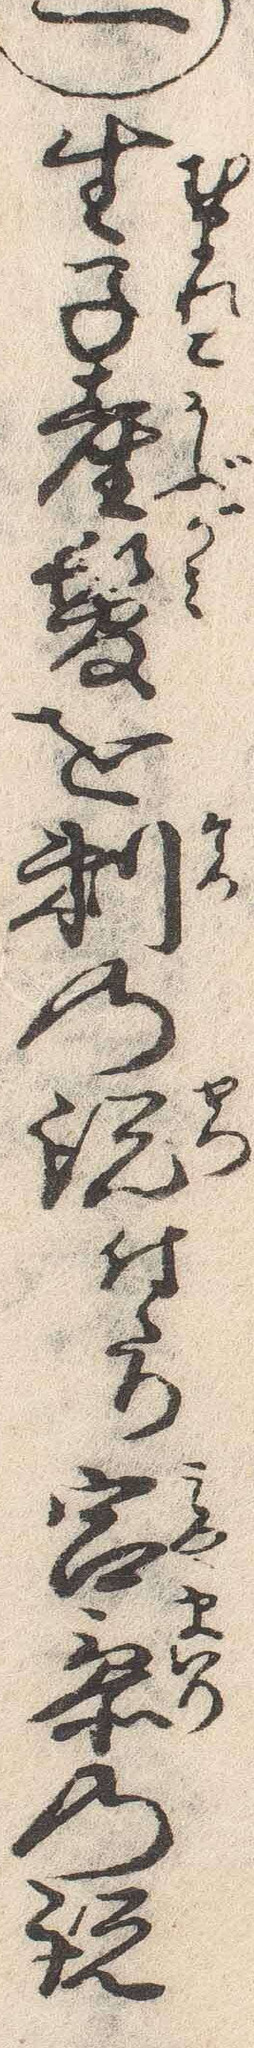㊁生子産髪を剃の説付たり宮參の説
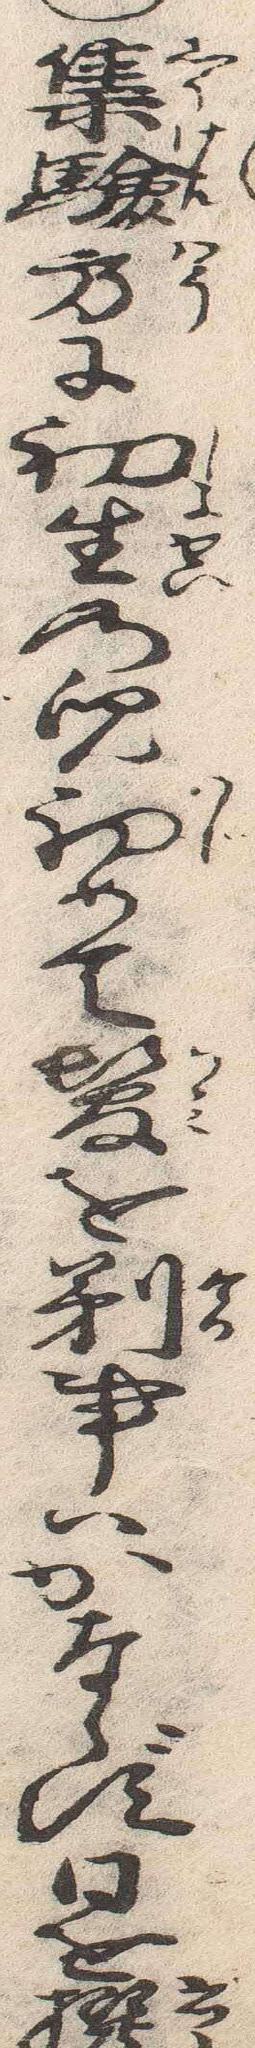◯集驗方に初生の児初めて髪を剃事はかならず日を撰
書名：小児必用養育草
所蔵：東京学芸大学附属図書館 国文学研究資料館
